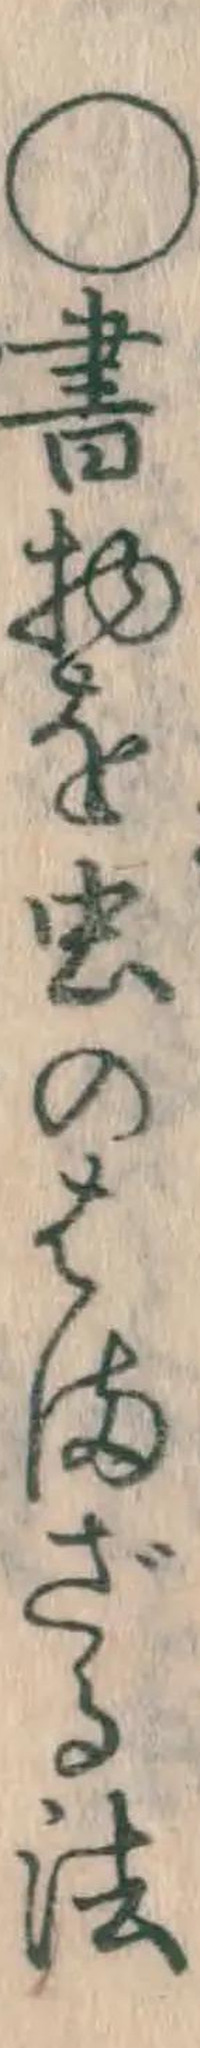○書物を虫のはまざる法
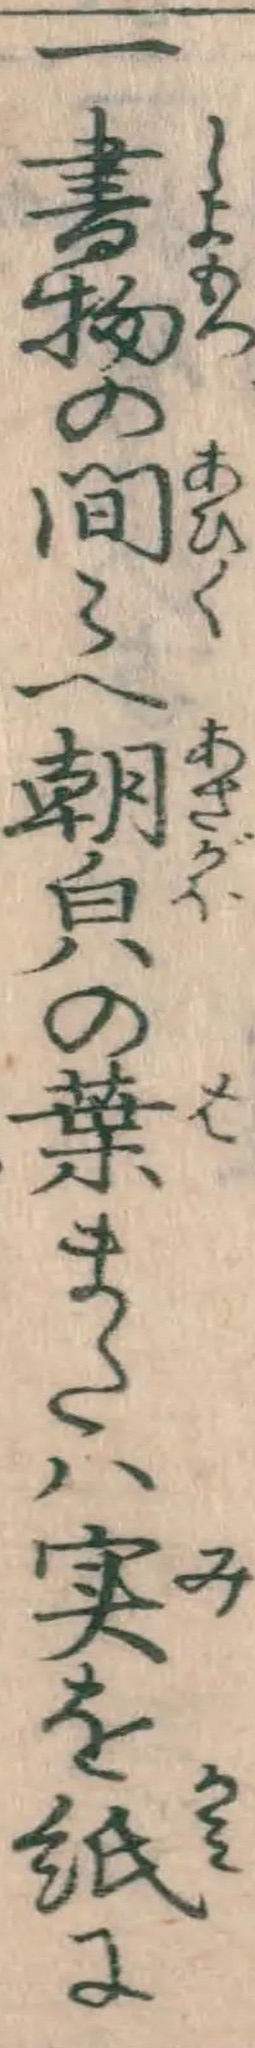一書物の間々へ朝㒵の葉または実を紙に
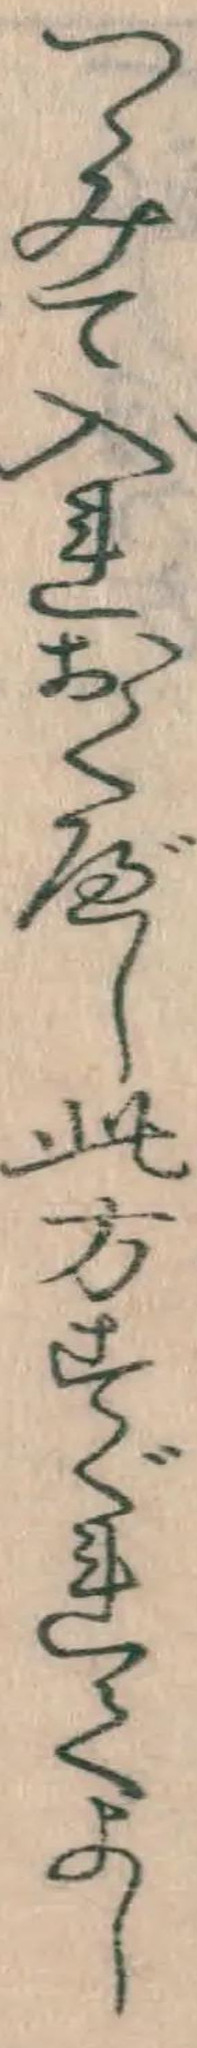つゝみて入れおくべし此方すぐれてよし
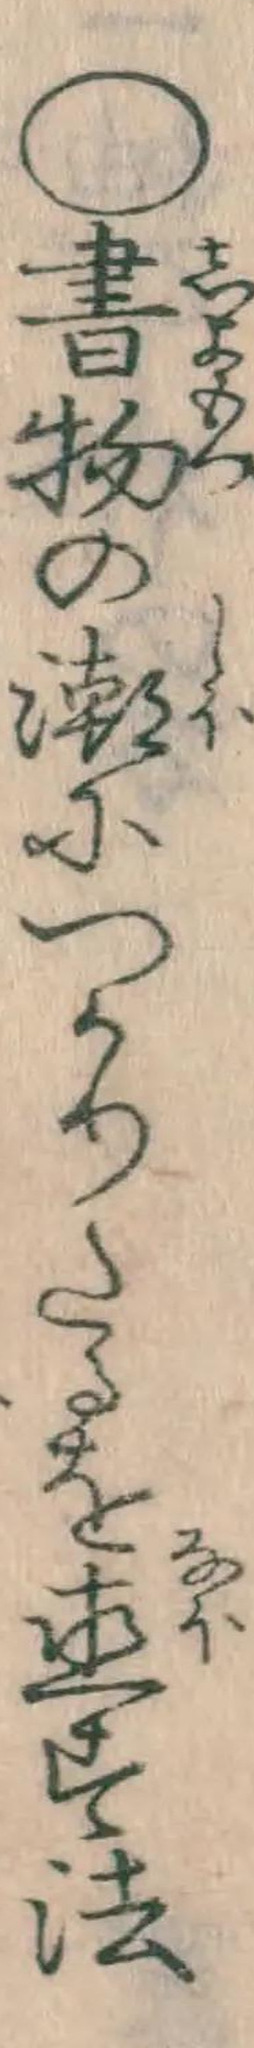○書物の潮につかりたるを直す法
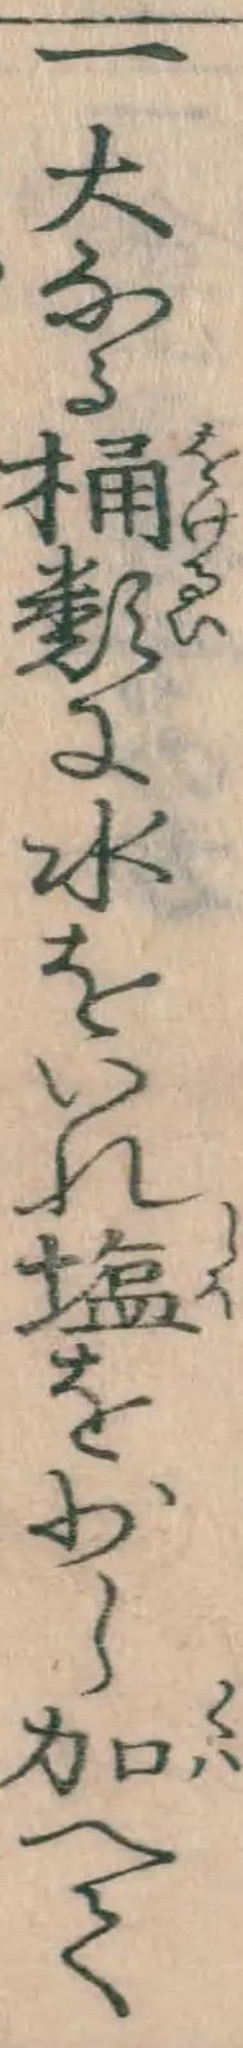一大なる桶類に水をいれ塩を少し加へて
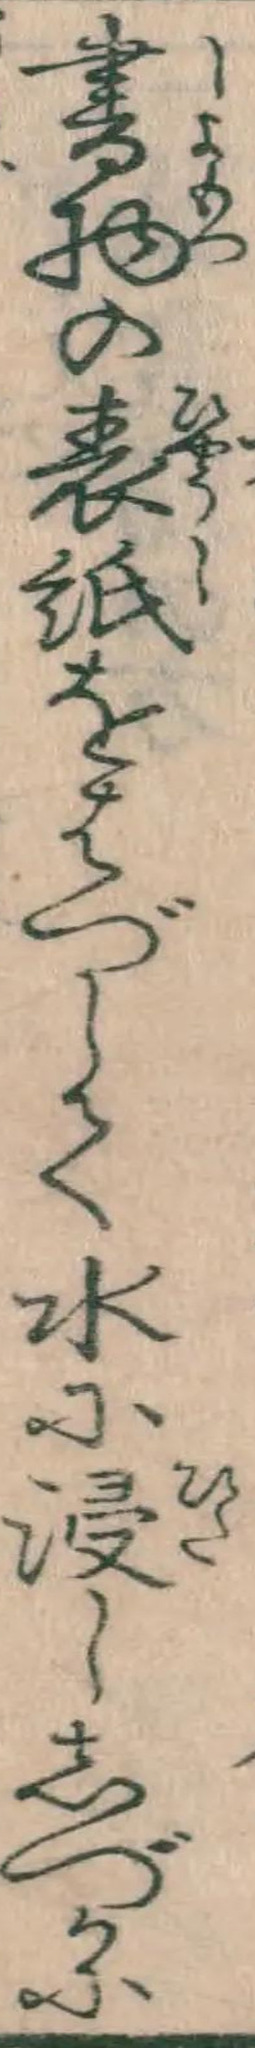書物の表紙をはづして水に浸ししづかに
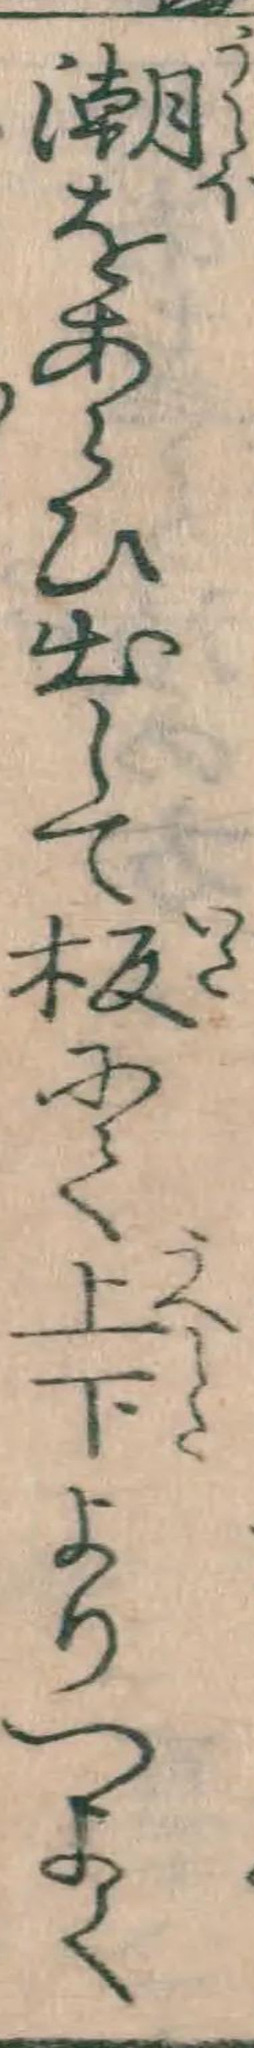潮をあらひ出して板にて上下よりつよく
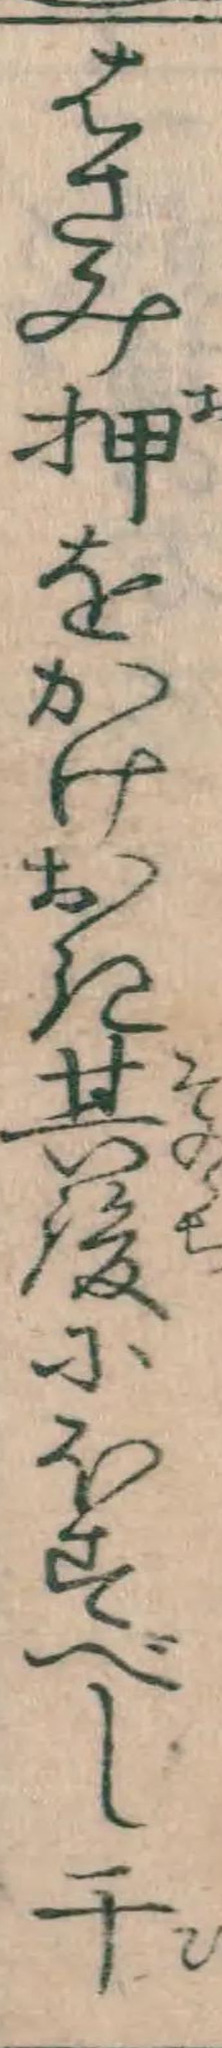はさみ押をかけおき其後にほすべし干
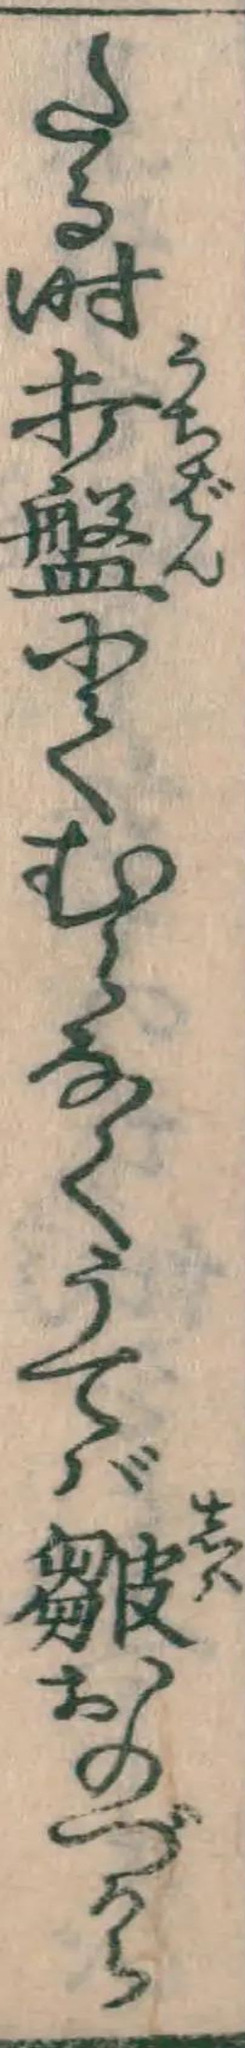たる時打盤にてむらなくうてば皺おのづから
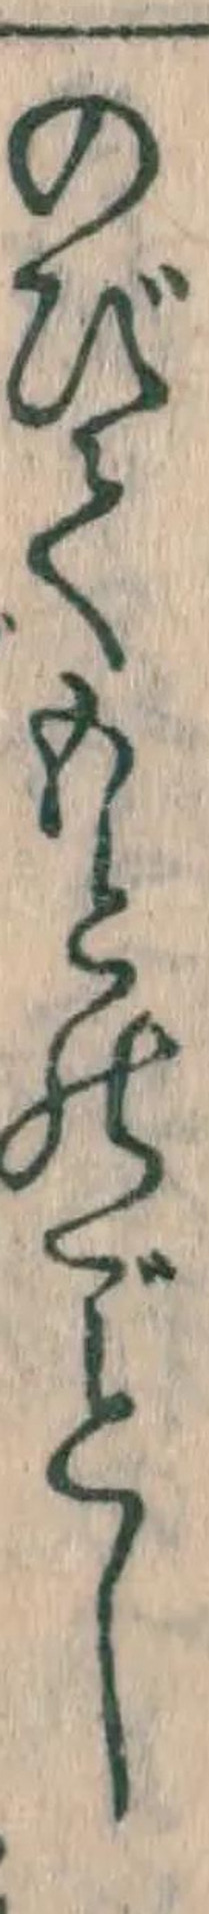のびてもとのごとし
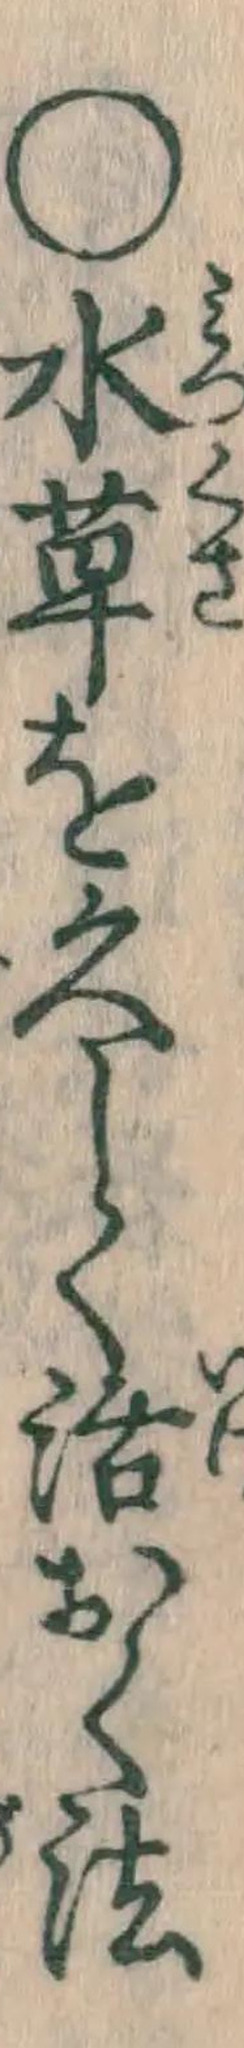○水草を久しく活おく法
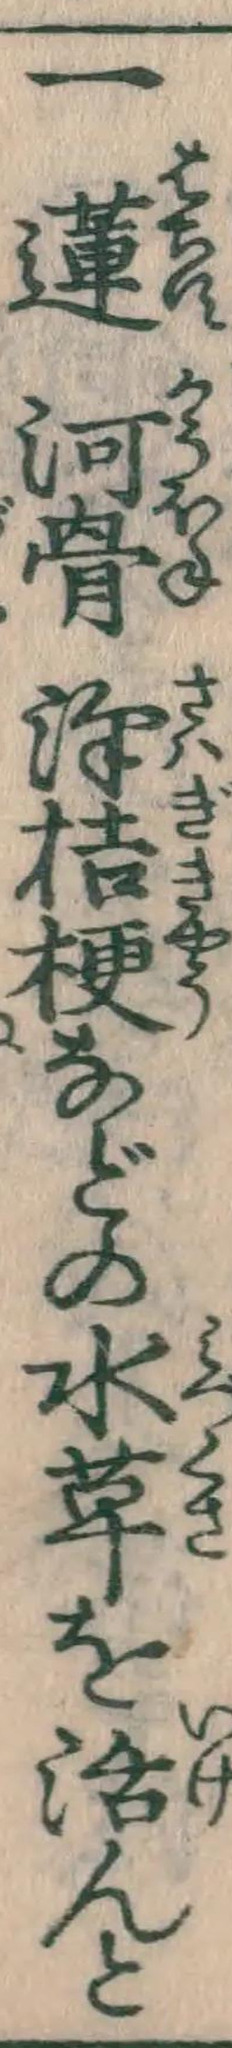一蓮河骨沢桔梗などの水草を活んと
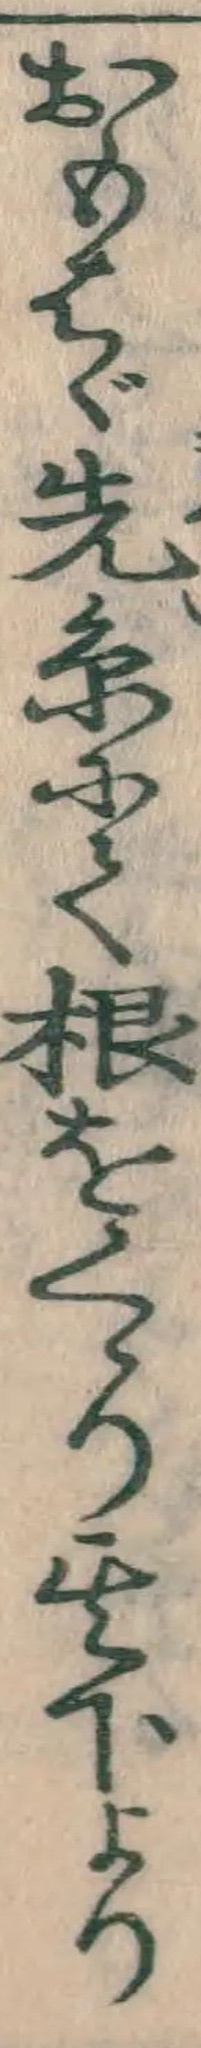おもはゞ先糸にて根をくゝり其下より
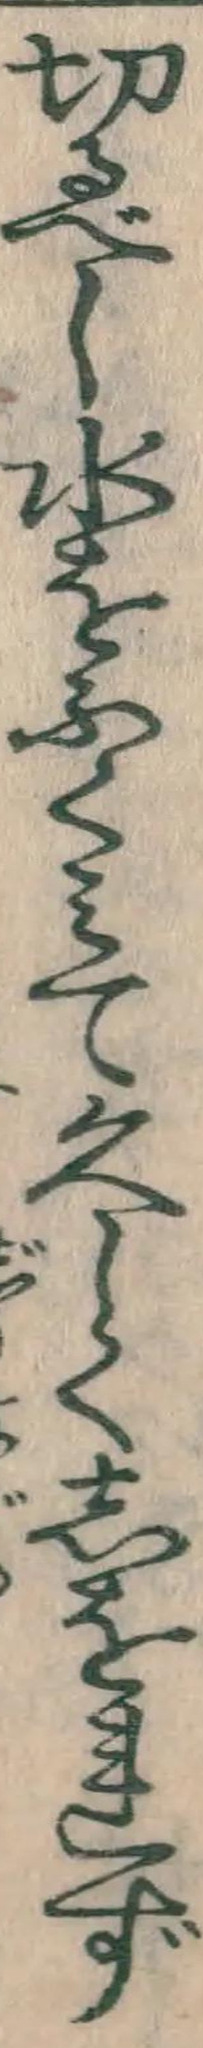切るべし水をふくみて久しくしをれず
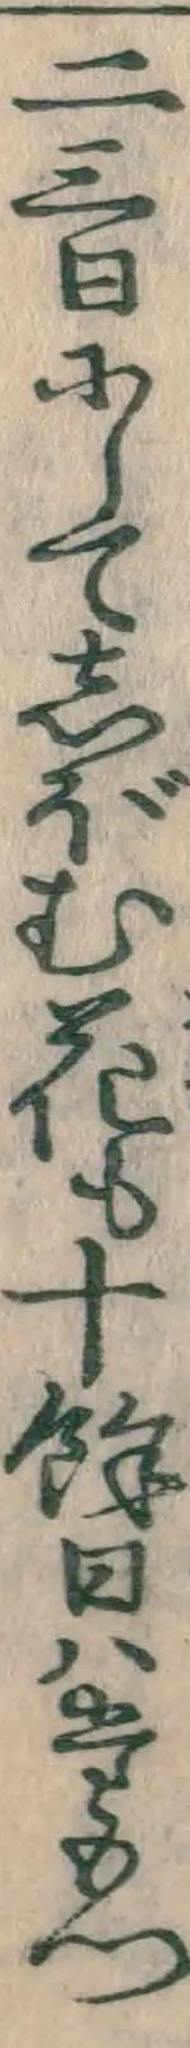二三日にしてしぼむ花も十余日はたもつ
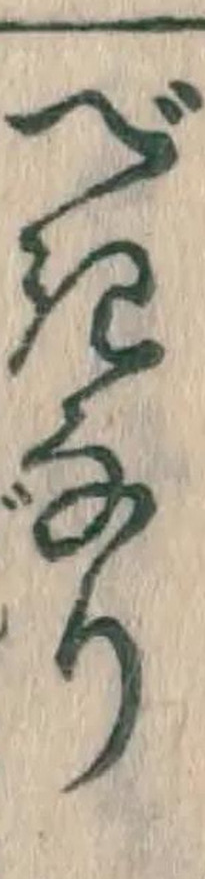べきなり
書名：広益秘事大全 3巻. [1]
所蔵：国立国会図書館 National Diet Library, JAPAN
